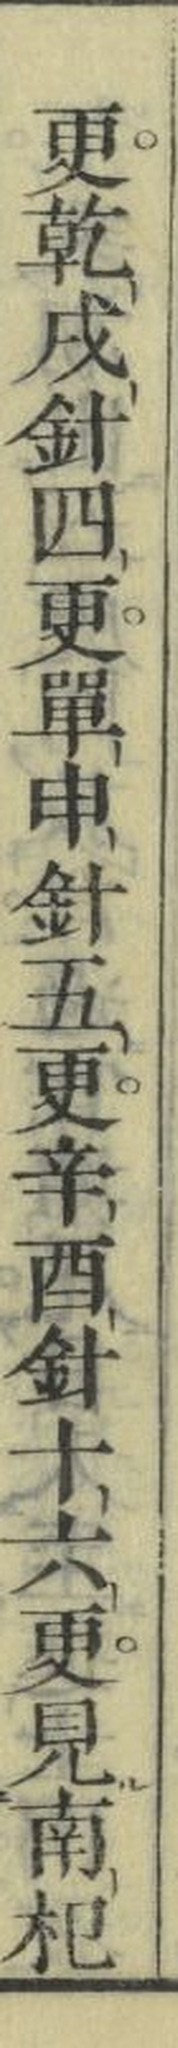更。乾-戌-針四-更。單-申-針五-更。辛-酉-針十-六-更。見南-杞
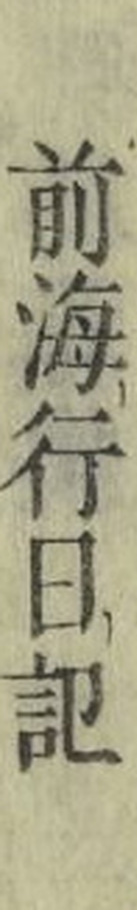前海-行日-記

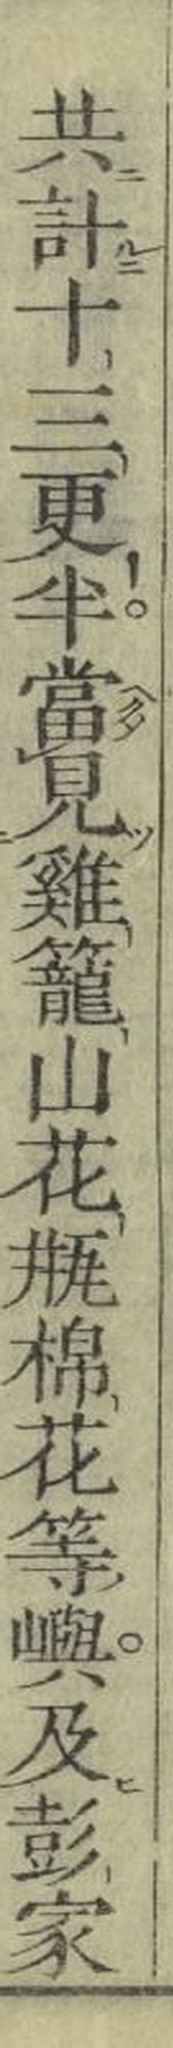共計十-三-更-半。當見雞-籠-山花-瓶棉-花等嶼。及彭-家
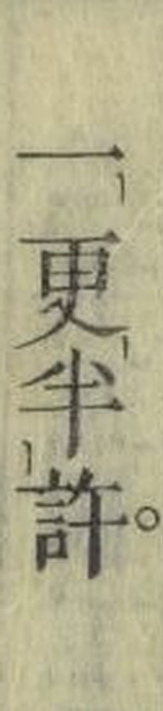一-更-半-許。

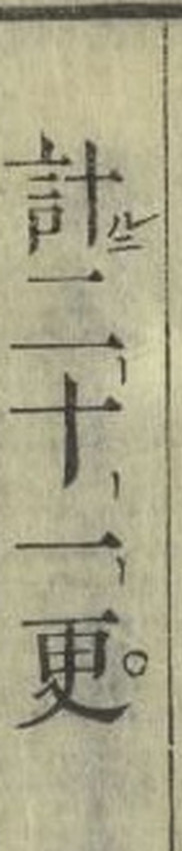計二-十-一-更。

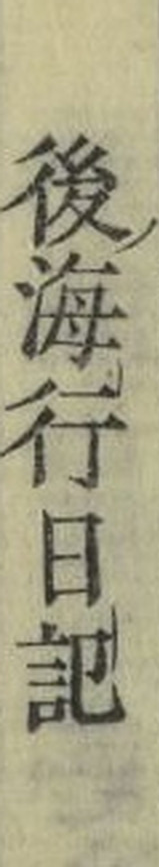後海-行日-記
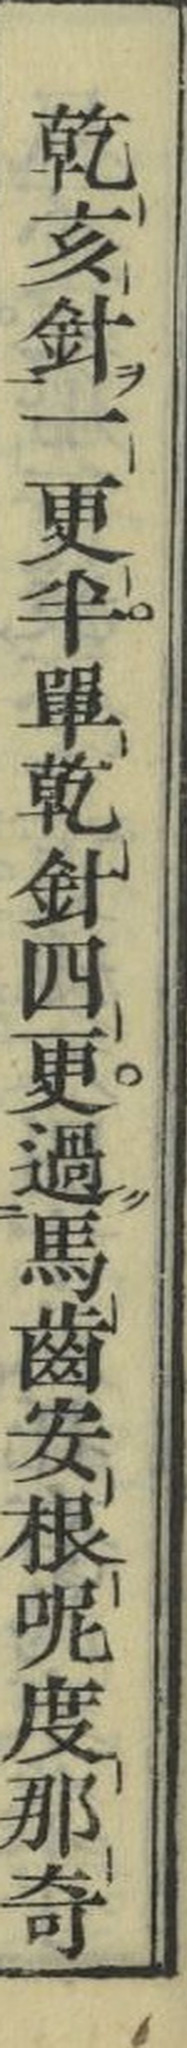乾-亥-針一-更-半。單-乾-針四-更。過馬-齒安-根-呢度-那-奇

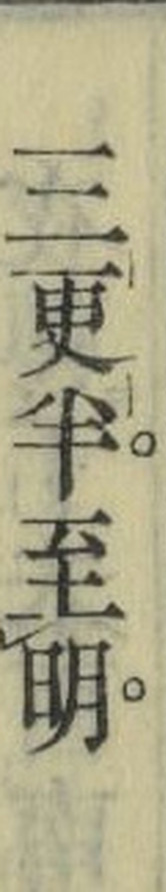三-更-半。至明。
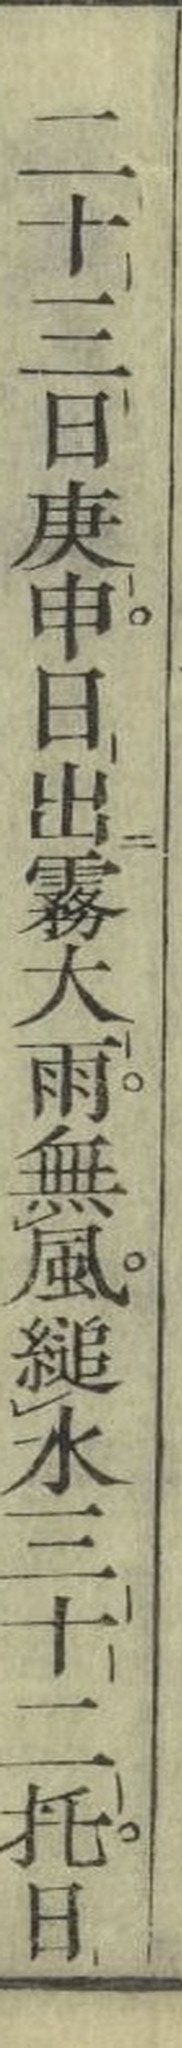二-十-三-日庚-申。日-出霧大-雨。無風。縋水三-十-二-托。日-

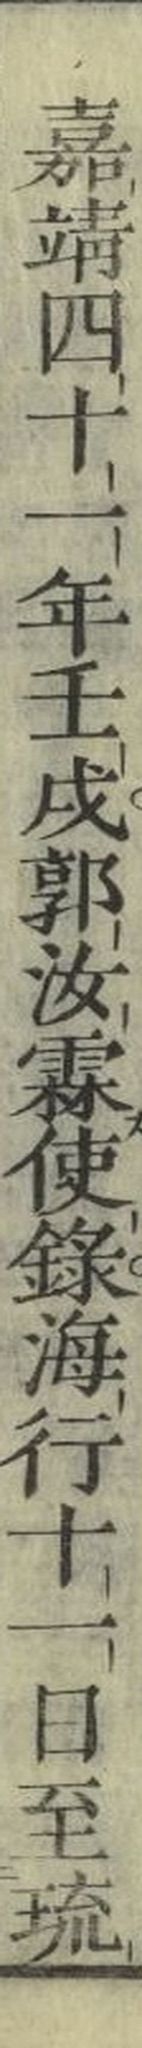嘉-靖四-十-一-年壬-戌。郭-汝-霖使-錄。海-行十-一-日至琉-

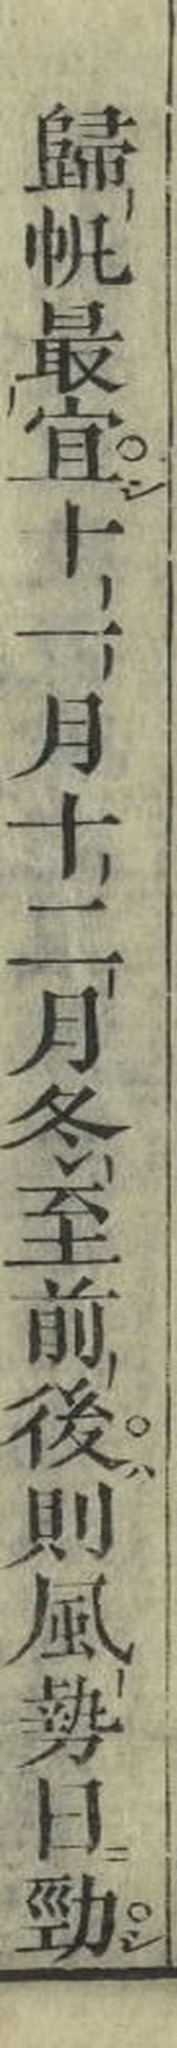歸-帆最-宜。十-一-月十-二-月冬-至前-後。則風-勢日勁。

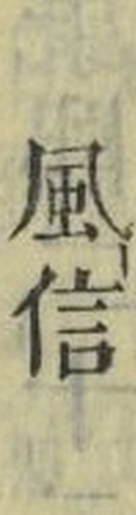風-信

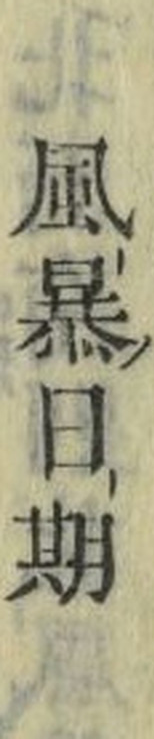風-暴日-期
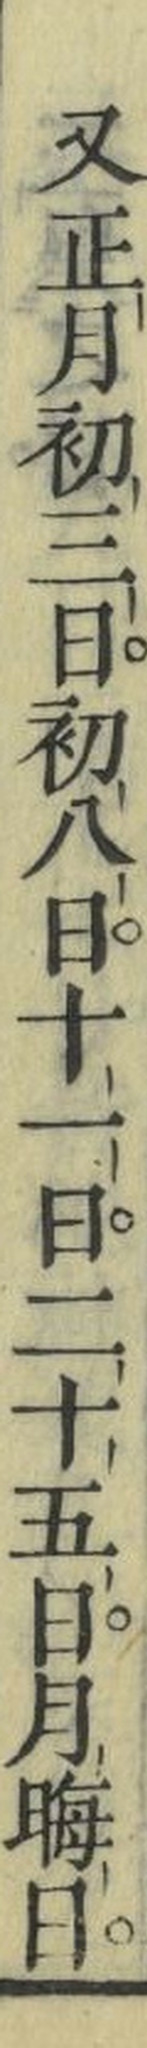又正-月初-三-日。初-八-日。十-一-日。二-十-五-日。月-晦-日。

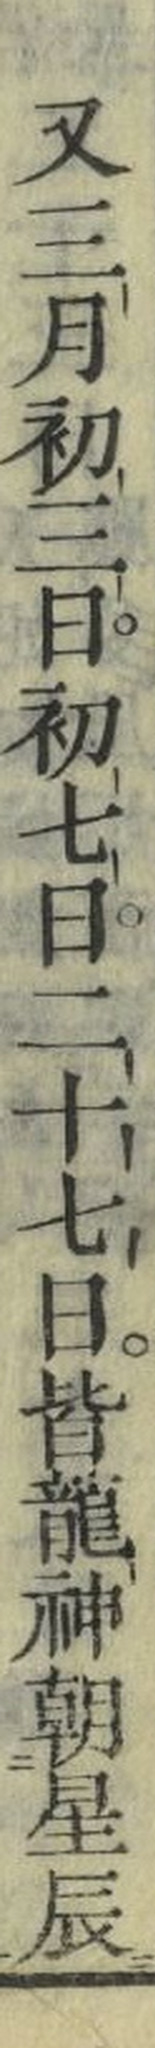又三-月初-三-日。初-七-日。二-十-七-日。皆龍-神朝星辰
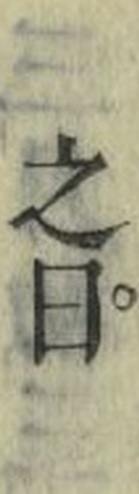之日。
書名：中山伝信録 巻一
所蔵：University of the Ryukyus Library
